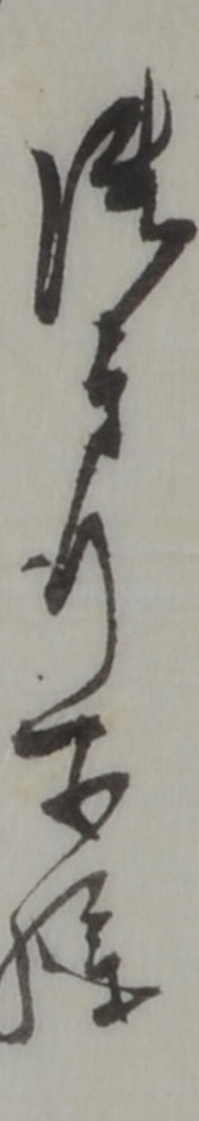御奉行所様
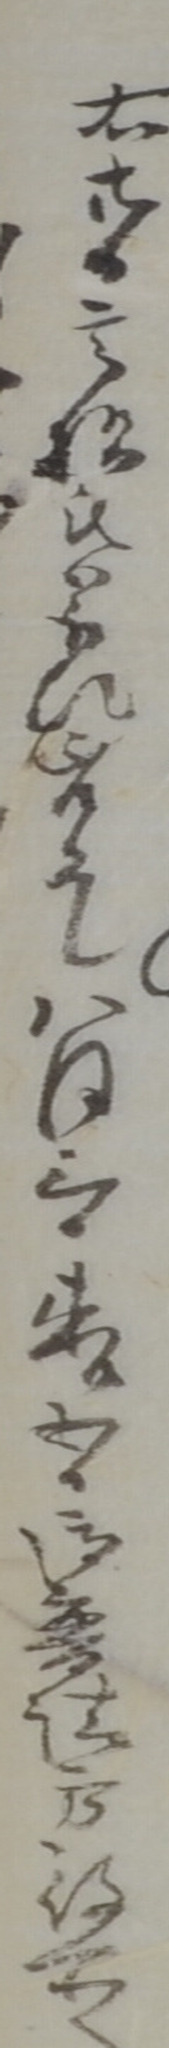右廿日高橋氏御取次差上候八月三日来ル五日御普請方役所
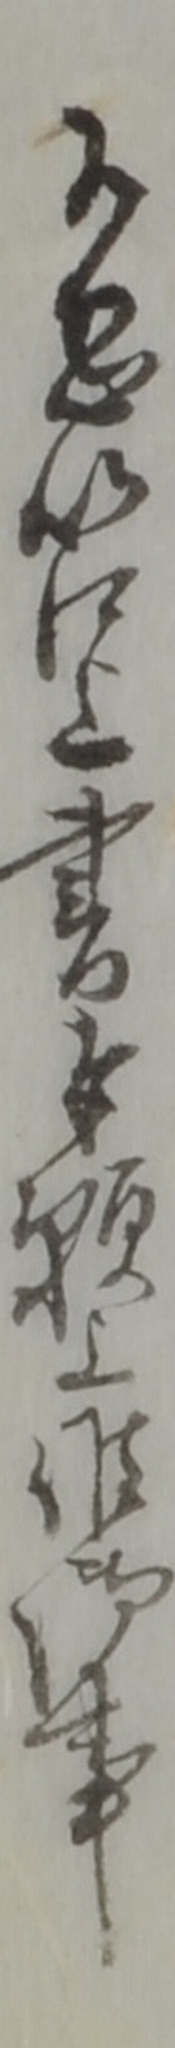乍恐以口上書奉願上候御事
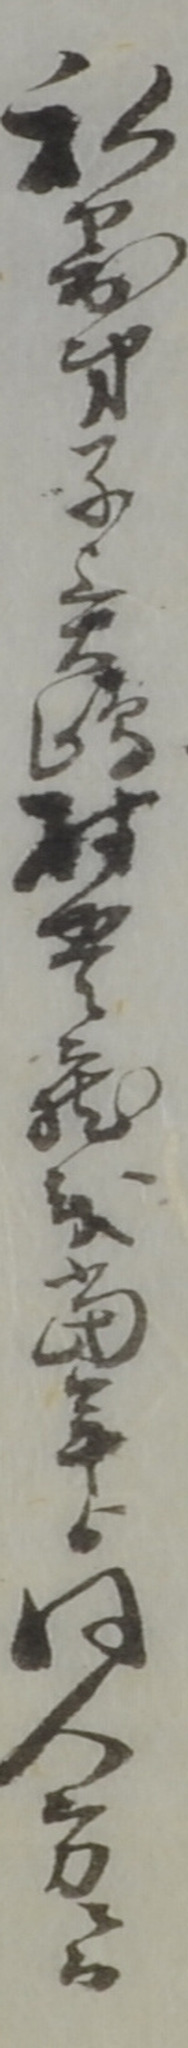私寄弟子上大嶋村平蔵義当年ゟ同人方ニ而
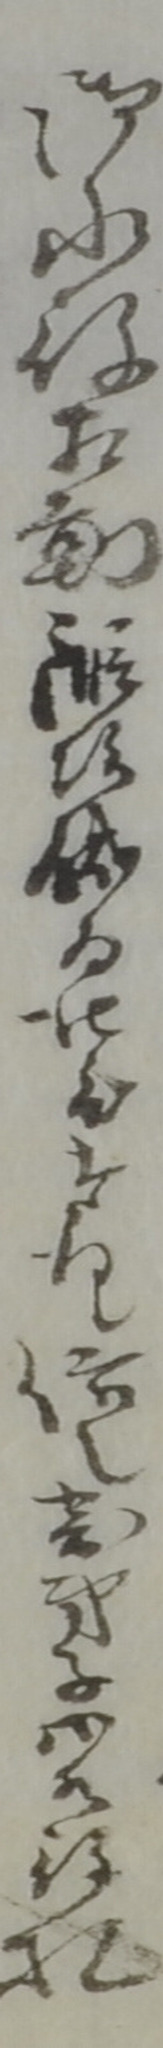御水役相勤鍛冶職為仕度奉存候依之寄弟子御水役札
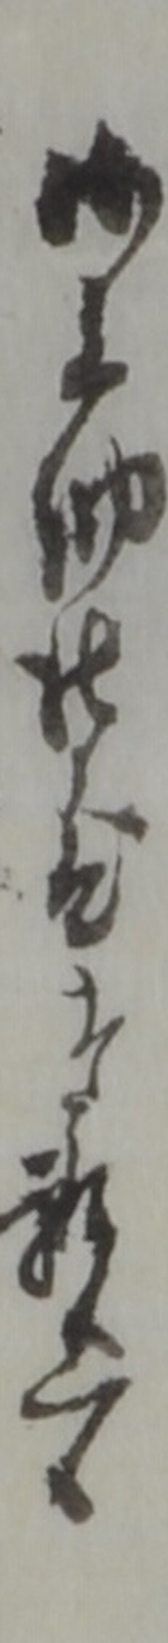御上納仕度奉願上候
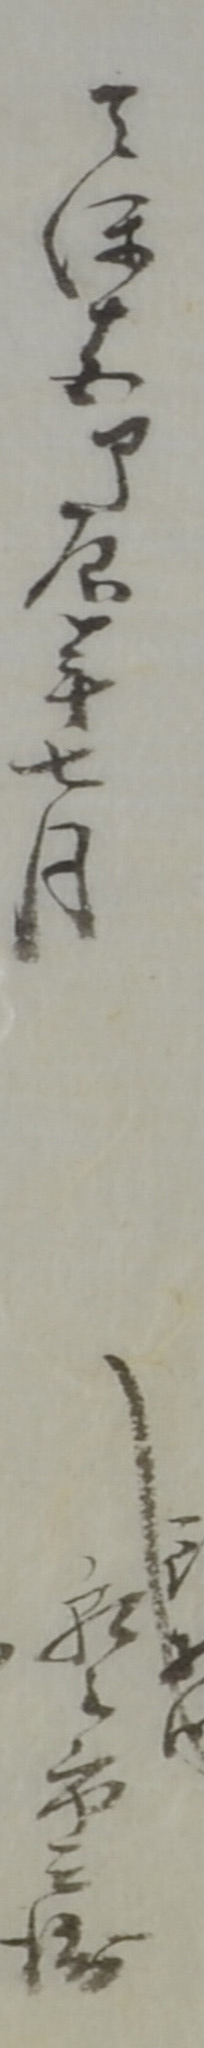天保十五甲辰年七月願主市兵衛
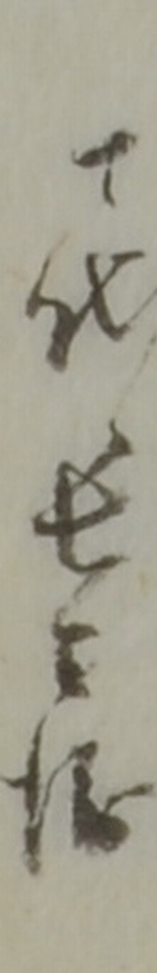丁代長兵衛
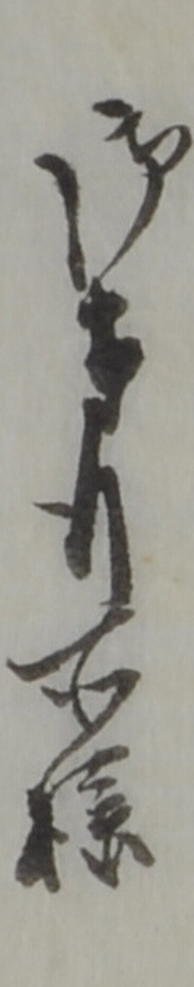御奉行所様
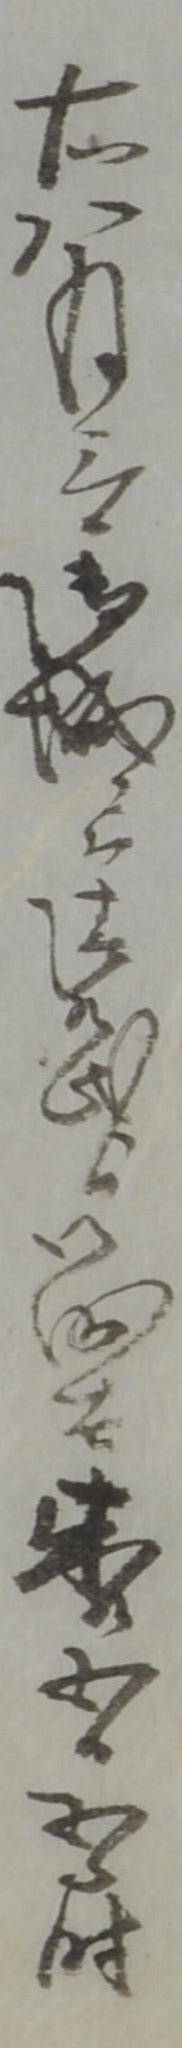右八月三日御城ニ而清水氏ゟ御沙汰来ル五日五つ時
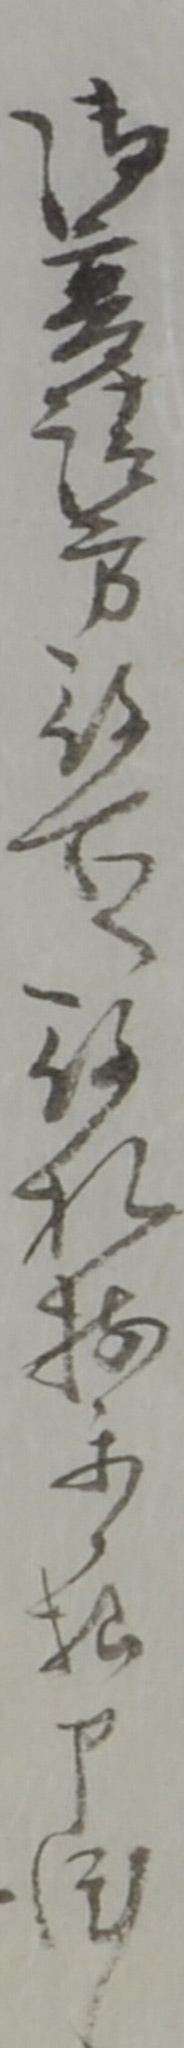御普請方役所へ役札持参候様申渡候

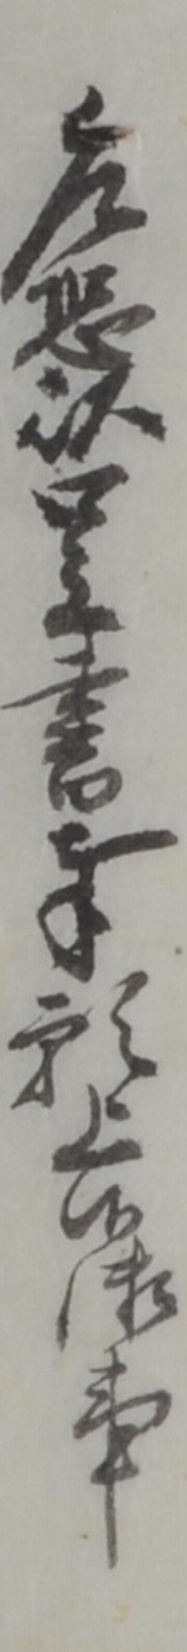乍恐以口上書奉願上候御事
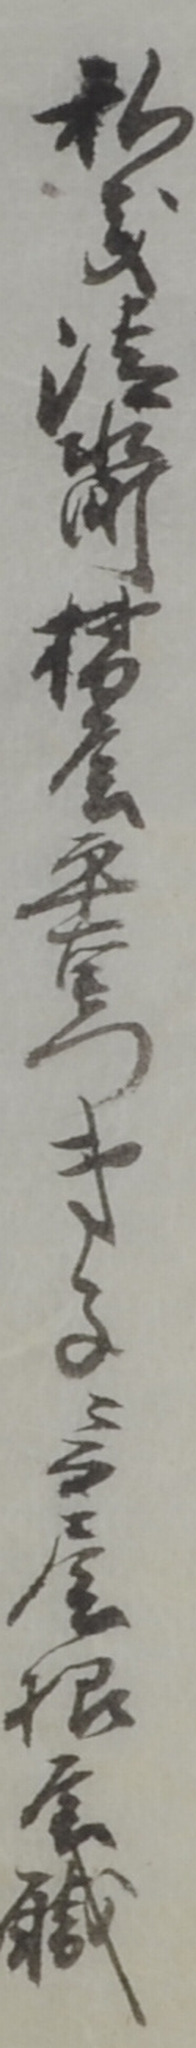私義清水町橋屋平右衛門弟子ニ而屋根屋職
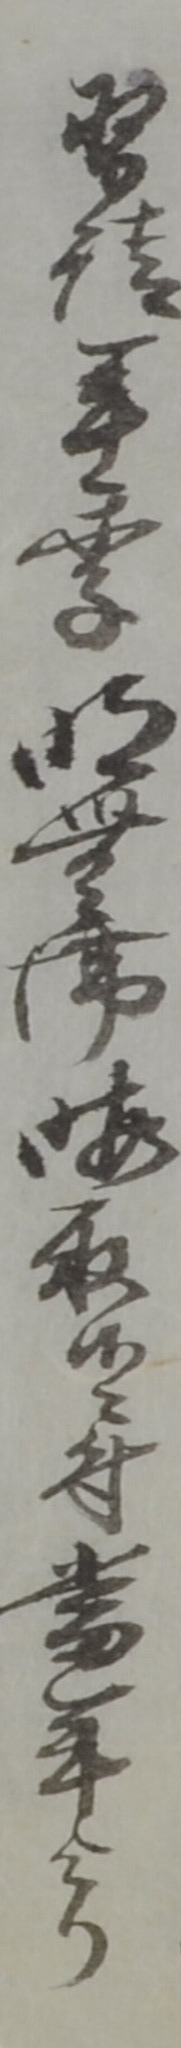習請年季明無滞暇取候ニ付当年より
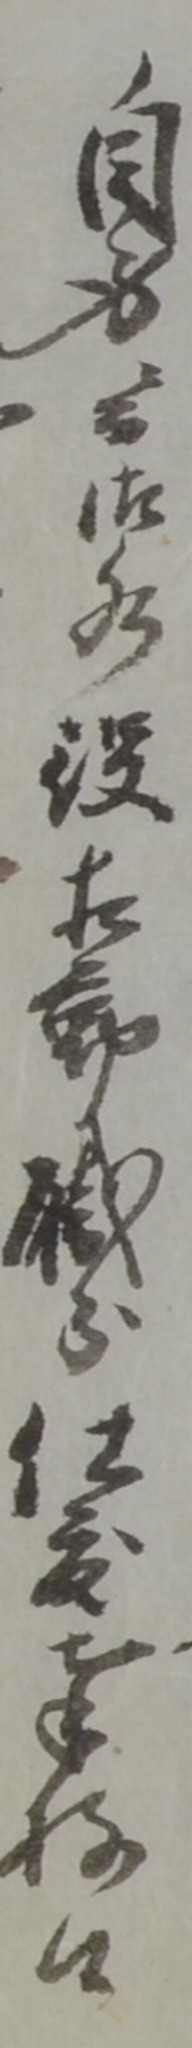自分ニ而御水役相勤職分仕度奉存候
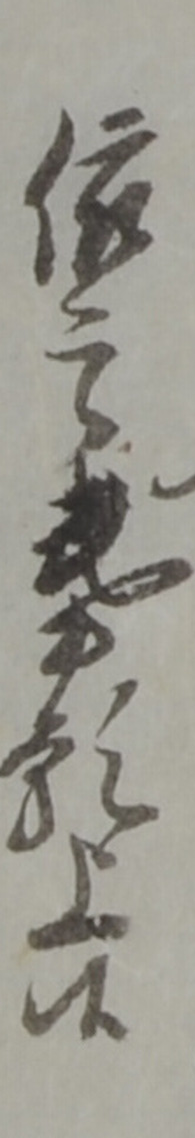依之希願上候
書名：諸願書控簿
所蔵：伊那市立高遠町図書館・合同会社AMANE
